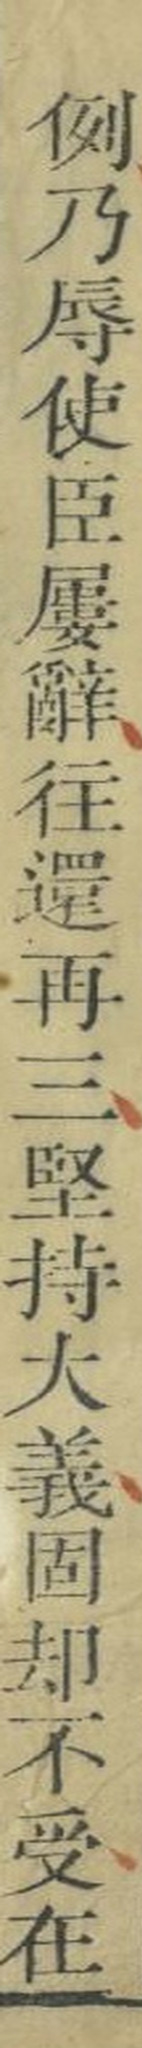例乃辱使臣屢辭往還再三堅持大義固却不受在
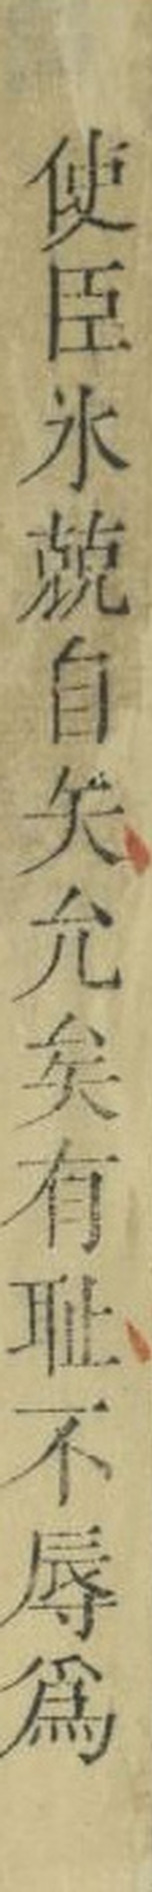使臣氷兢自矢允矣有耻不辱爲
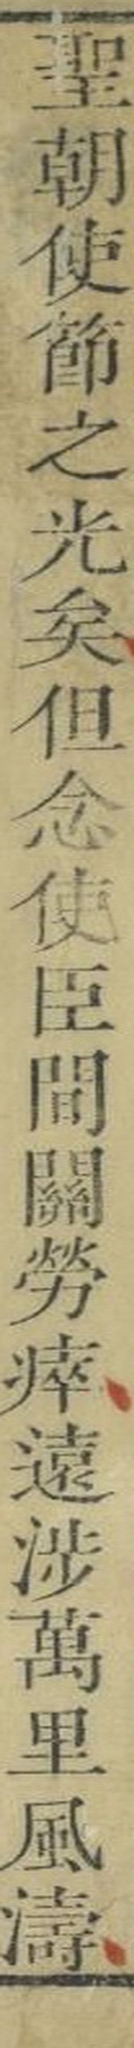聖朝使節之光矣但念使臣間關勞瘁遠涉萬里風濤
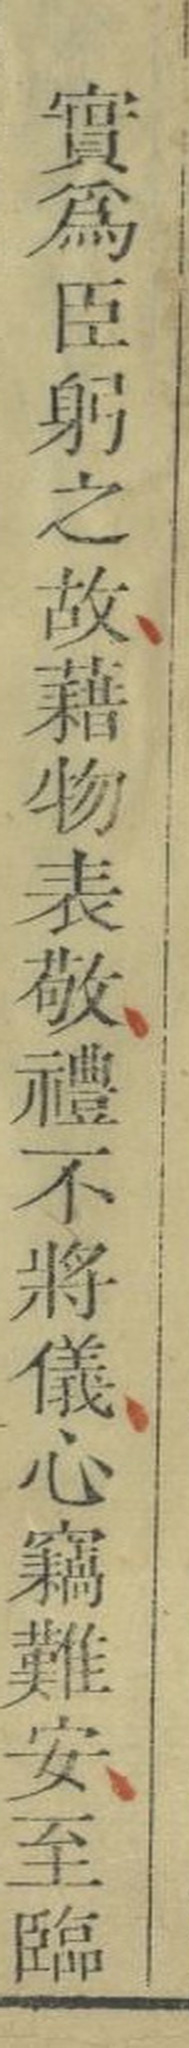實爲臣躬之故藉物表敬禮不將儀心竊難安至臨
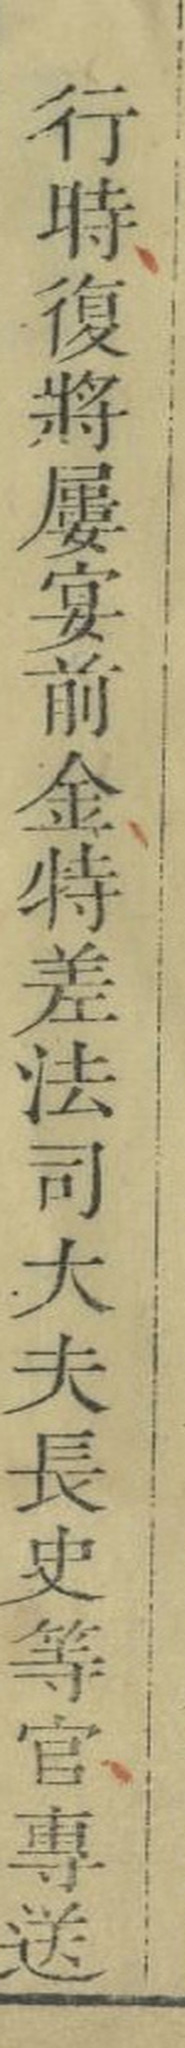行時復將屢宴前金特差法司大夫長史等官專送
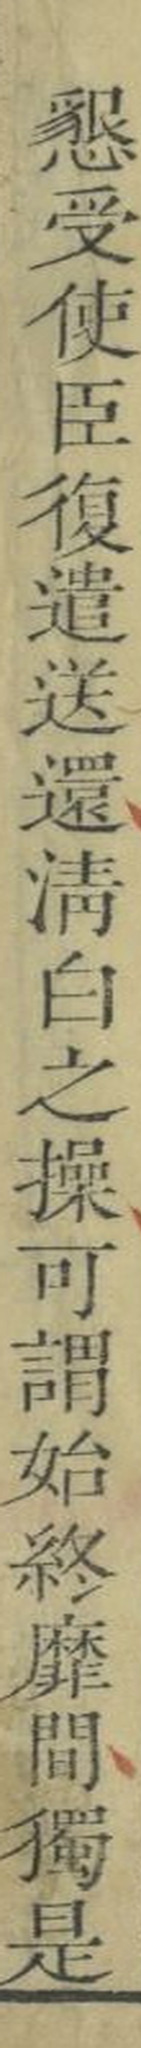懇受使臣復遣送還淸白之操可謂始終靡間獨是
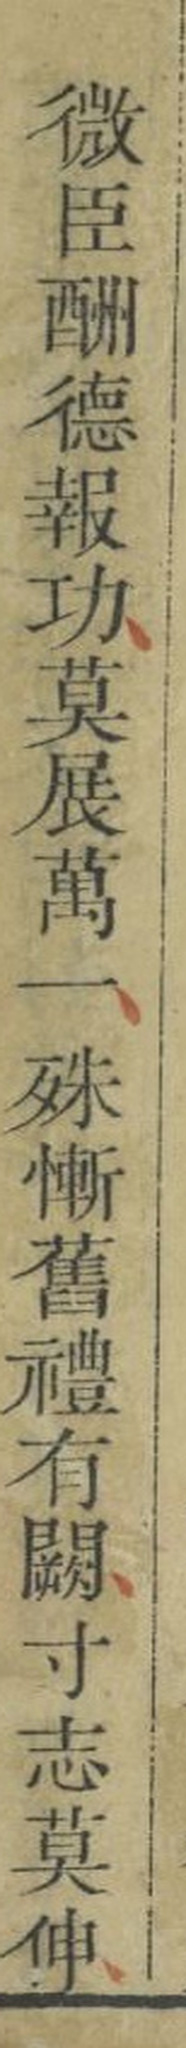微臣酬德報功莫展萬一殊慚舊禮有闕寸志莫伸

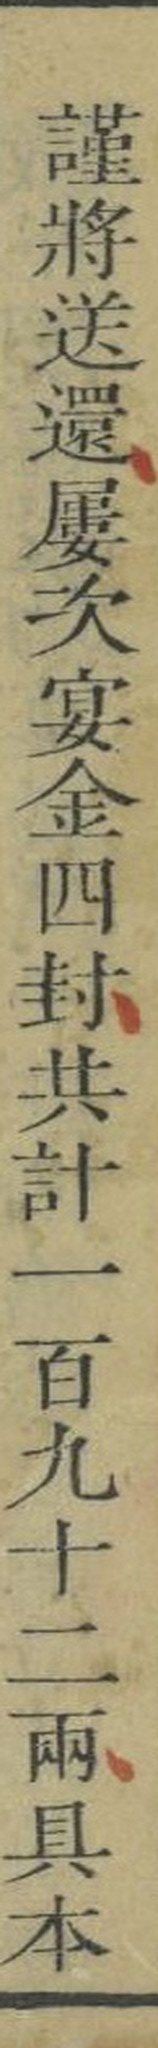謹將送還屢次宴金四封共計一百九十二兩具本
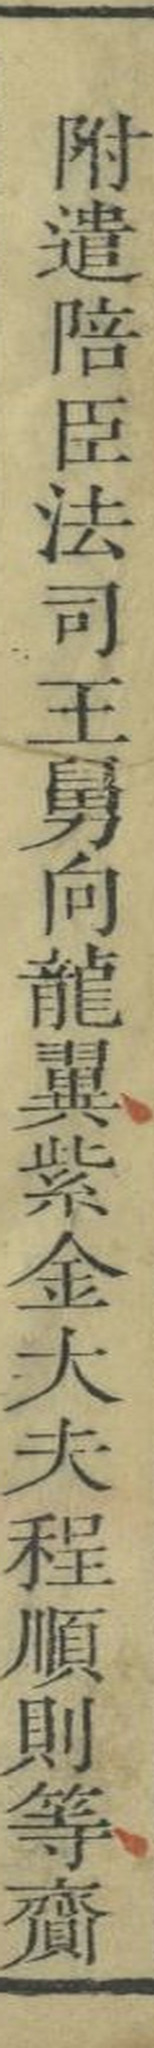附遣陪臣法司王舅向龍翼紫金大夫程順則等齎
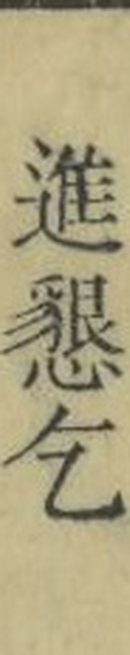進懇乞
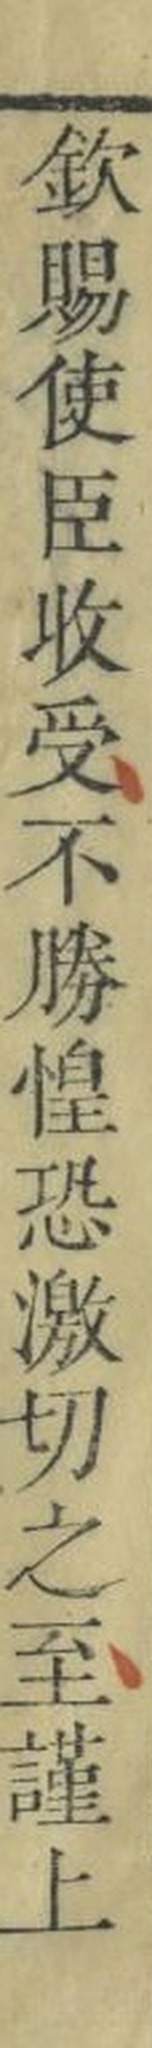欽賜使臣收受不勝惶恐激切之至謹上
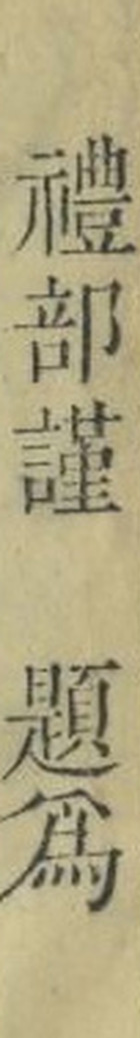禮部謹題爲
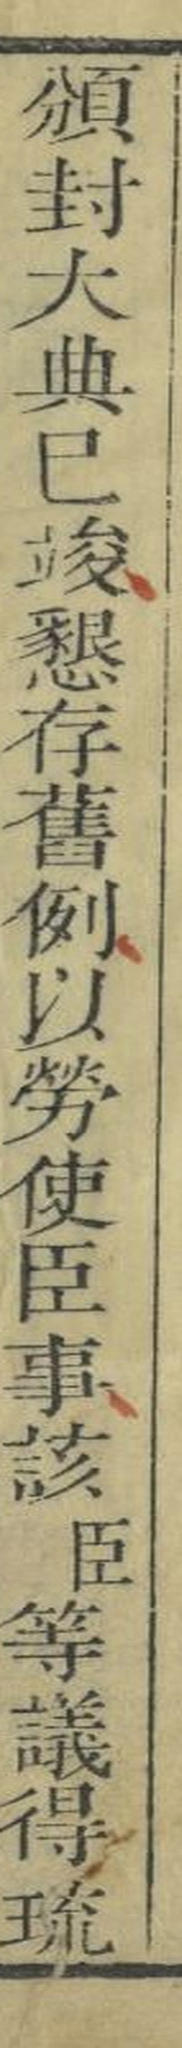領封大典巳竣懇存舊例以勞使臣事該臣等議得琉
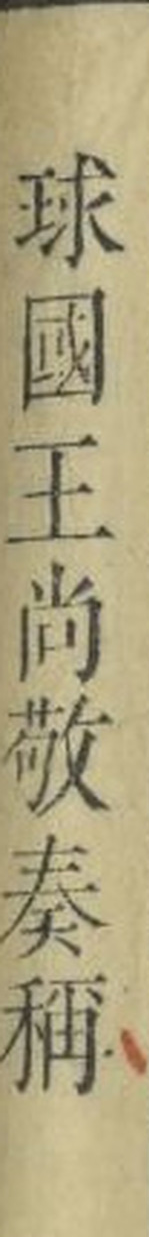球國王尚敬奏稱
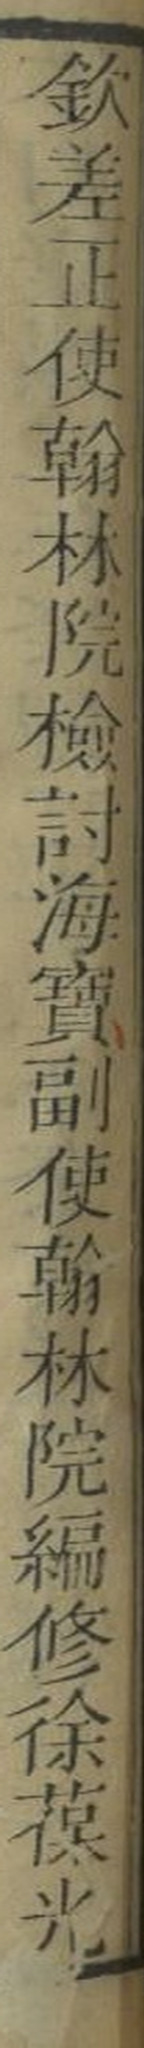欽差正使翰林院檢討海寶副使翰林院編修徐葆光
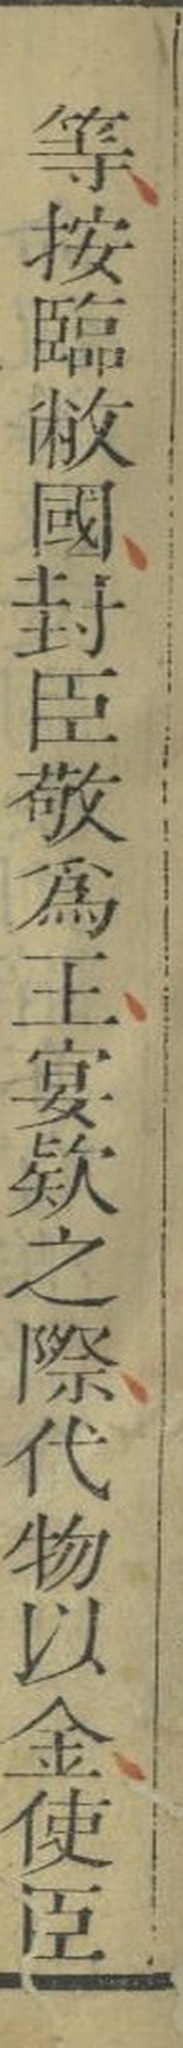等按臨敝國封臣敬爲王宴欵之際代物以金使臣
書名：中山伝信録 巻一、巻二
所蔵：University of the Ryukyus Library
